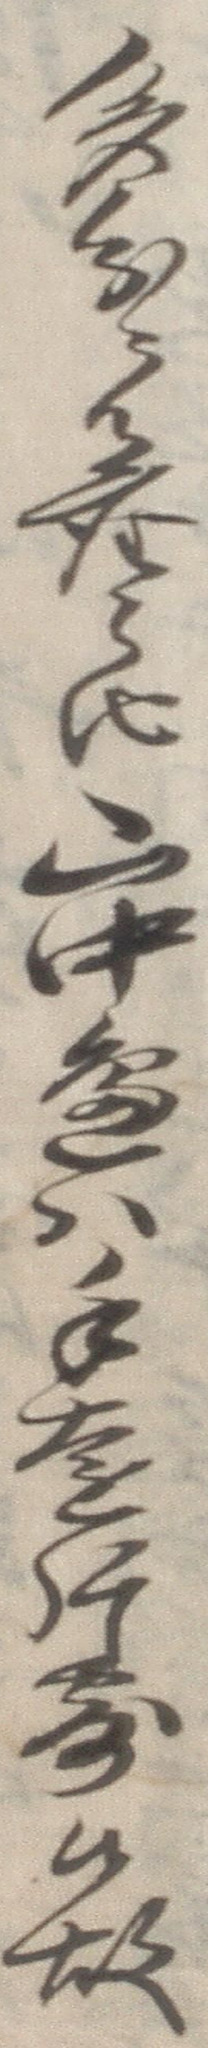多分に御座候由山中辺ハ手遠片寄候故
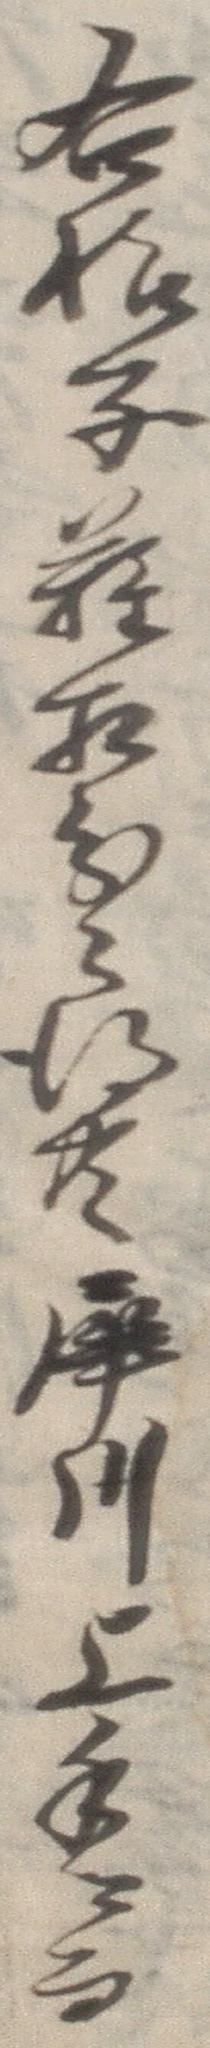右様子難相分候得共犀川上手二而
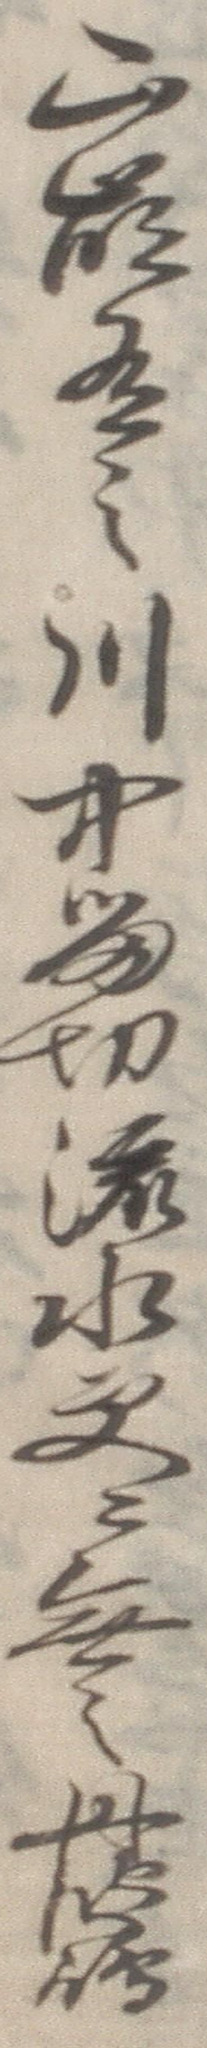山崩有之川中留切流水更二無之丹波嶋
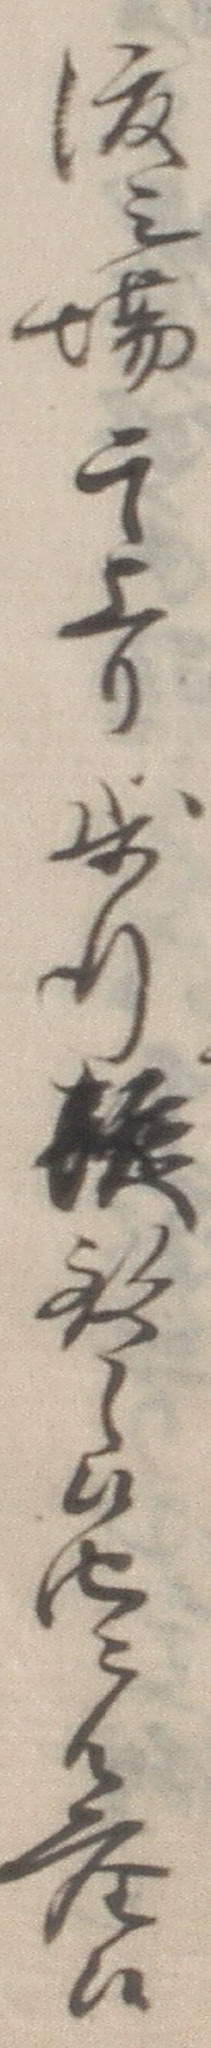渡ㇱ場干上り歩行賑致し候由二御座候
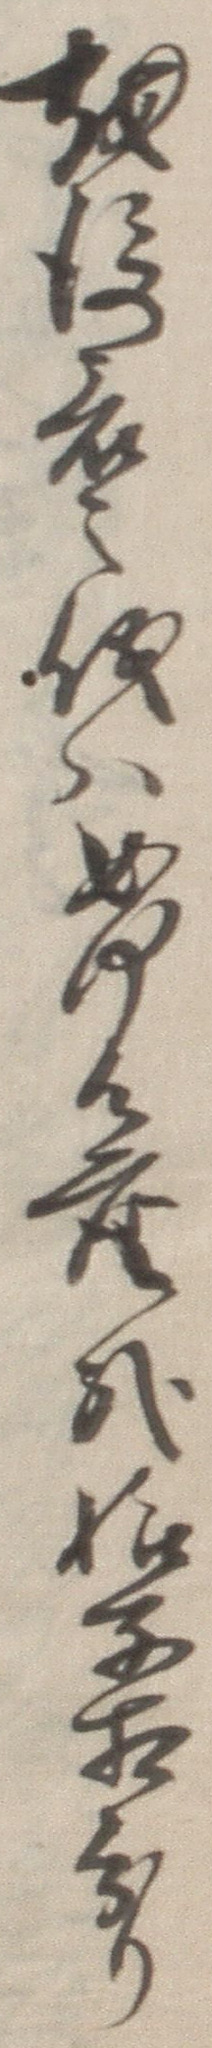越後表之儀ハ如何御座候哉様子相分り
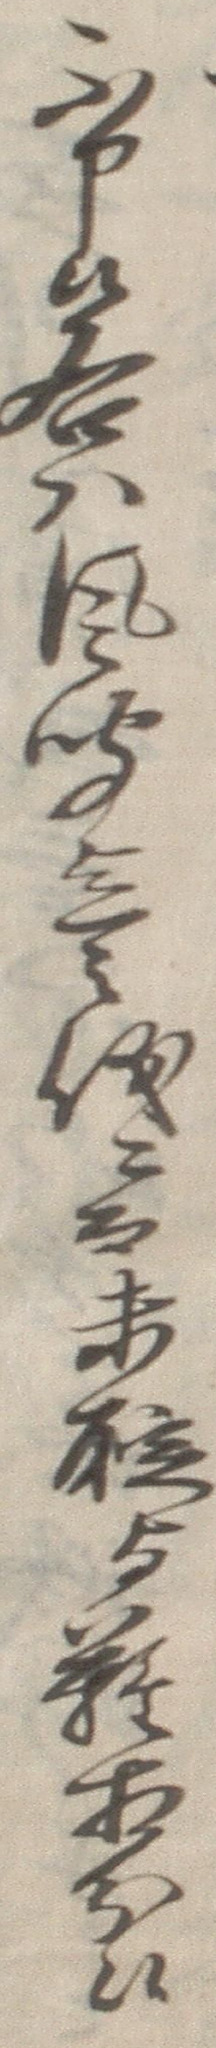不申候右ハ風聞迄之儀二而未聢と難相分候
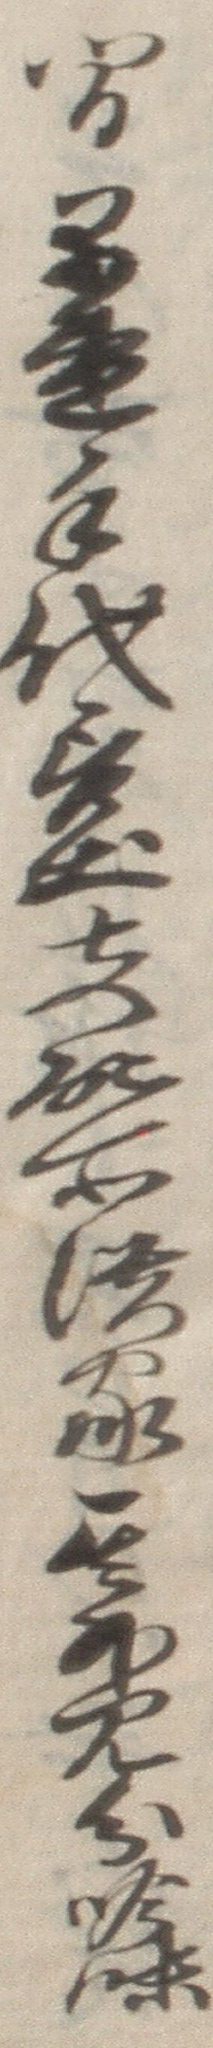間早速手代差出支配所潰家其外見分吟味
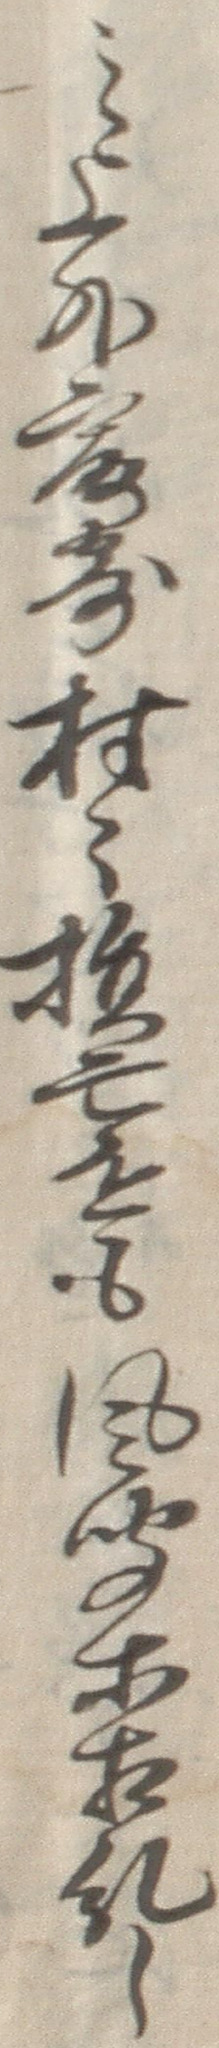之上外最寄村々損亡をも風聞等相糺し
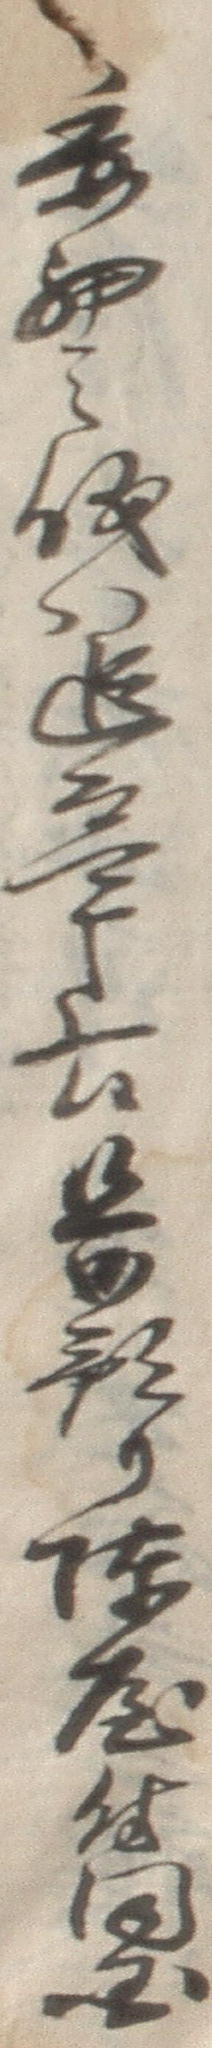委細之儀ハ追而可申上候且御預り陣屋付同国
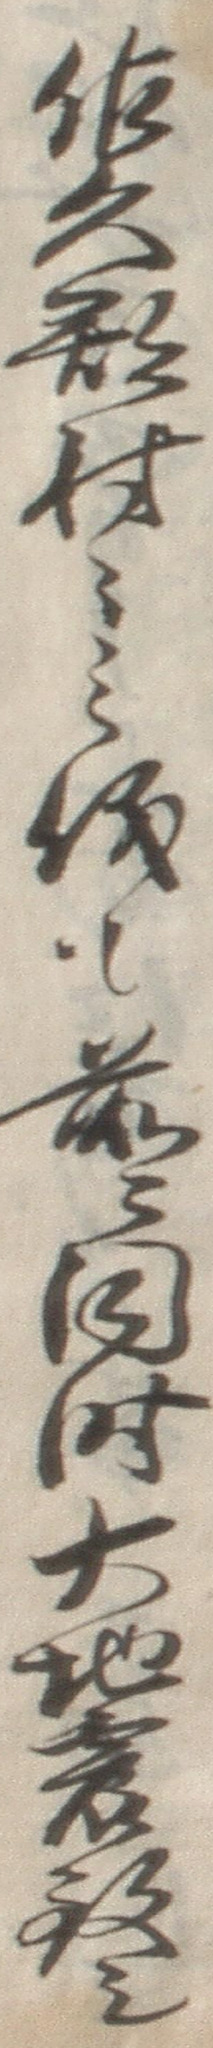佐久郡村々之儀も前二同時大地震致し
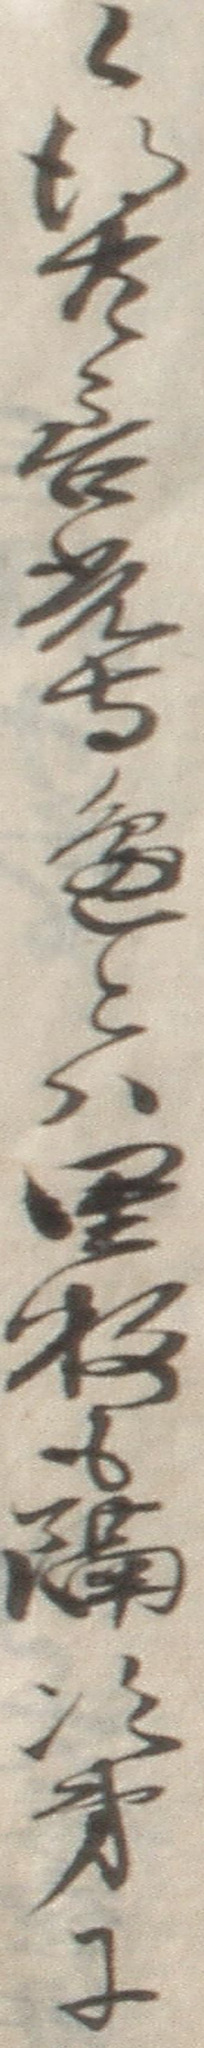候得共善光寺辺とハ里数も隔次第に
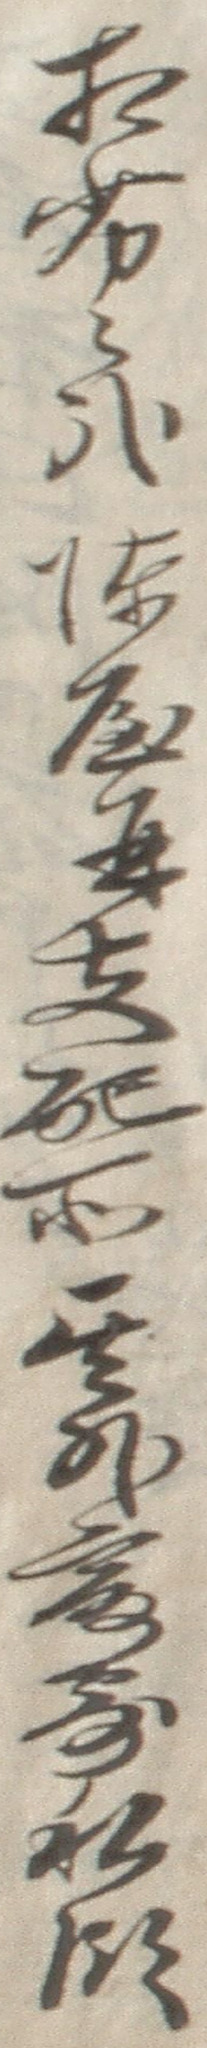相劣候哉陣屋并支配所其外最寄私領
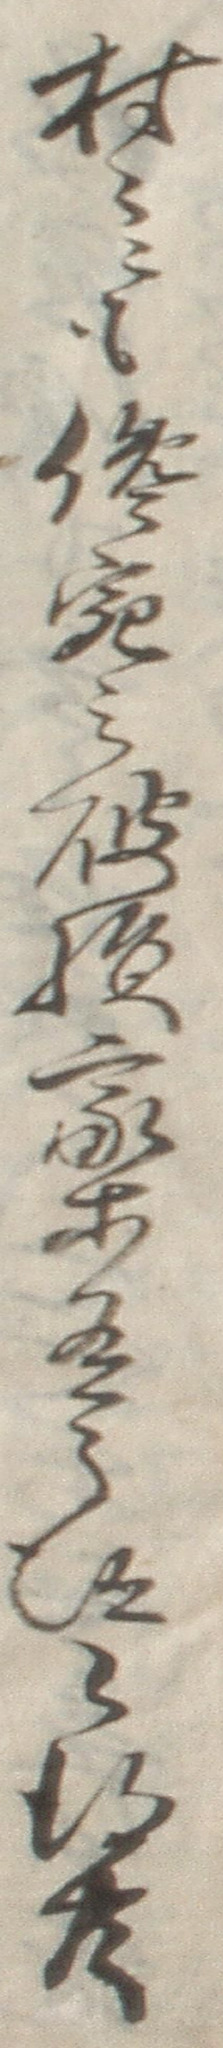村々二も纔宛之破損家等有之趣候得共

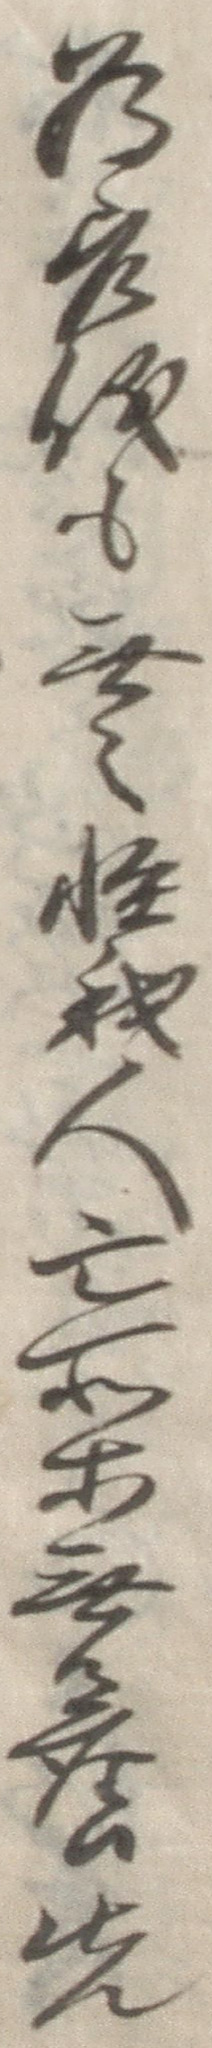為差儀も無之怪我人亡所等無御座候先
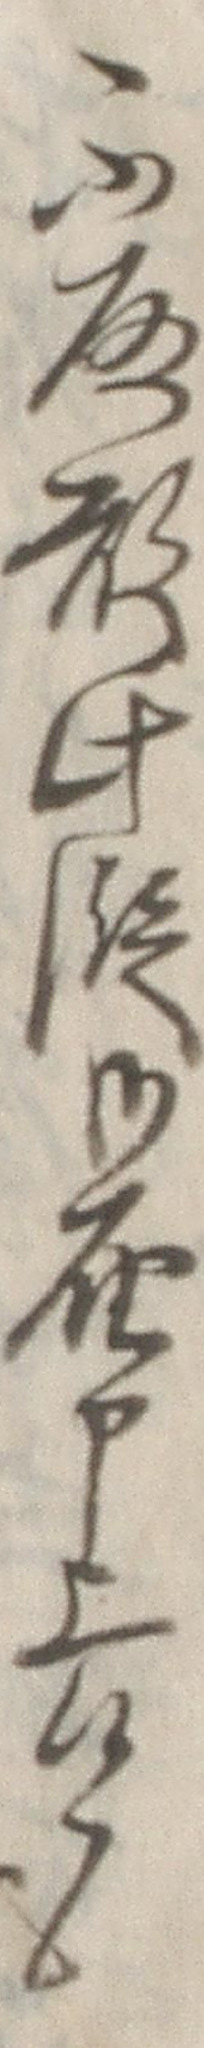不取敢此段御届申上候以上
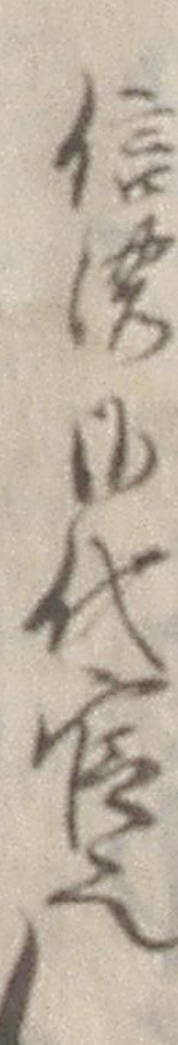信濃御代官也
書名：信州地震一件
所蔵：東京大学地震研究所図書室 Earthquake Research Institute Library, The University of Tokyo, JAPAN
